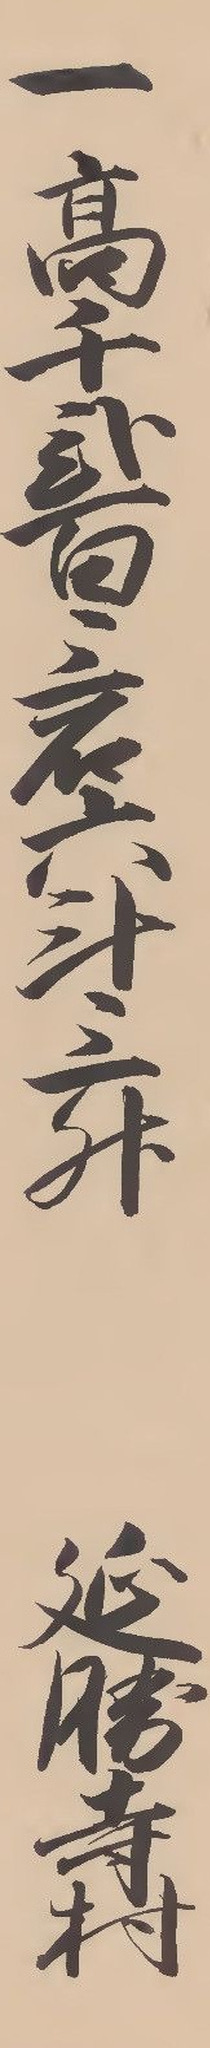一高千弐百三石六斗三升延勝寺村
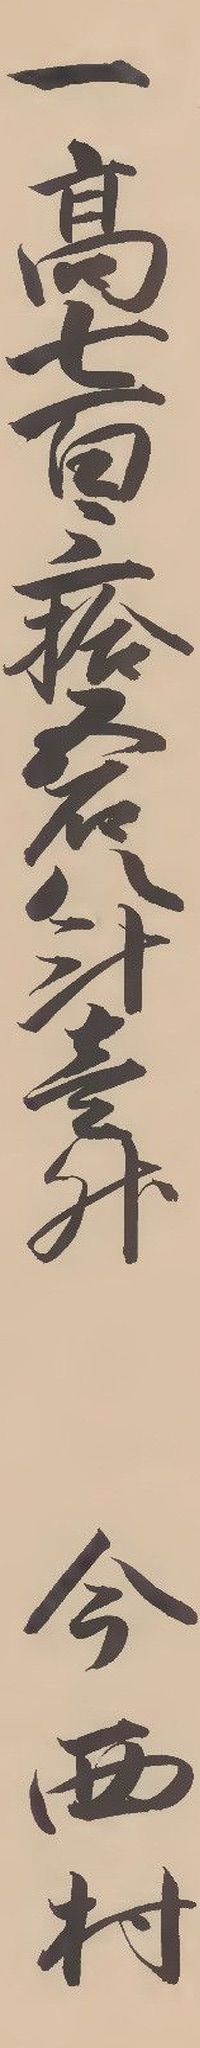一高七百三拾五石八斗壱升今西村
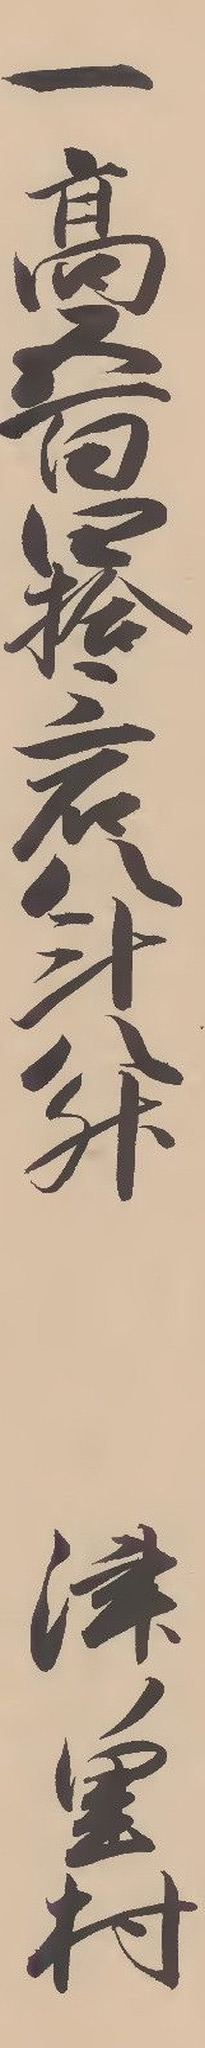一高五百四拾三石八斗八升津ノ里村
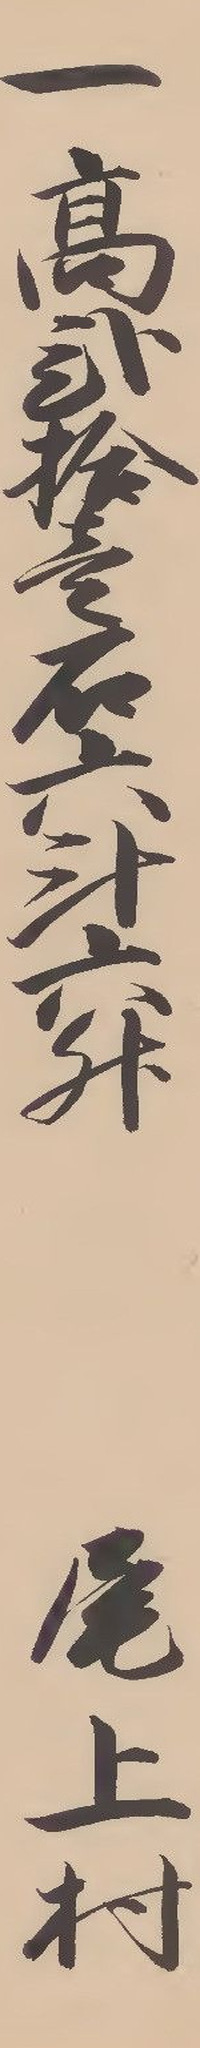一高弐拾壱石六斗六升尾上村

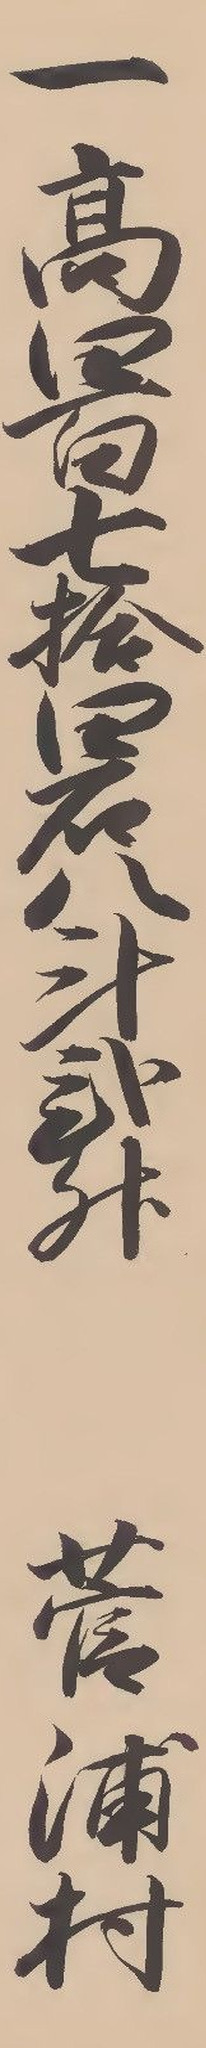一高四百七拾四石八斗弐升菅浦村
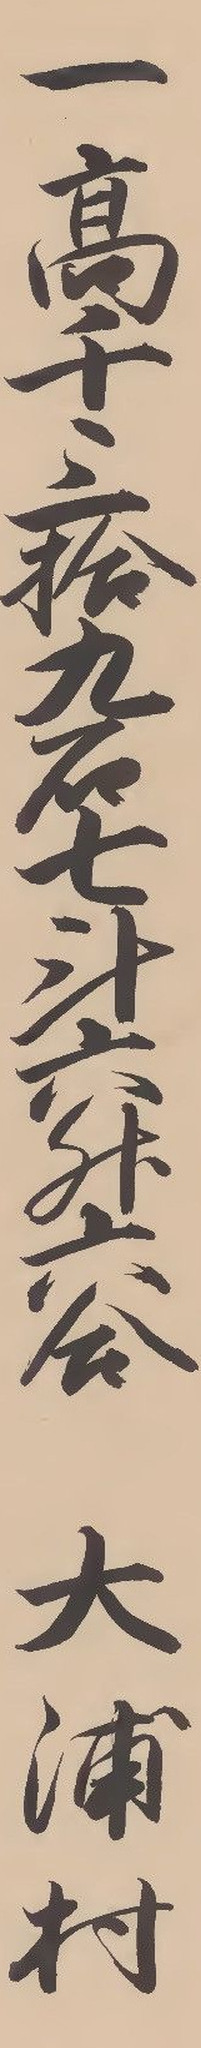一高千三拾九石七斗六升六合大浦村
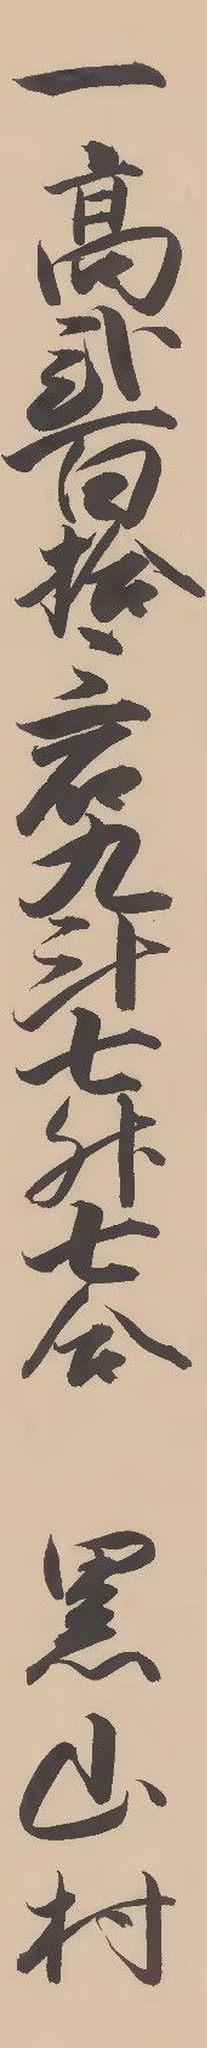一高弐百拾三石九斗七升七合黒山村
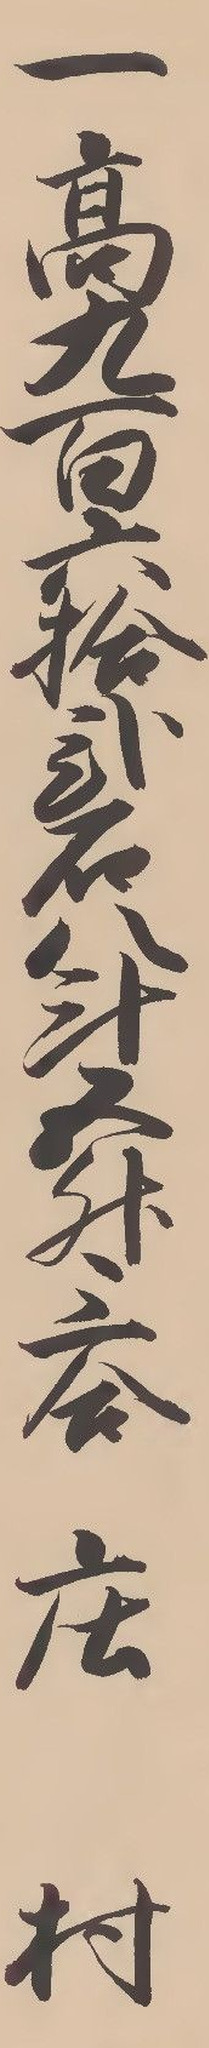一高九百六拾弐石八斗五升三合庄村
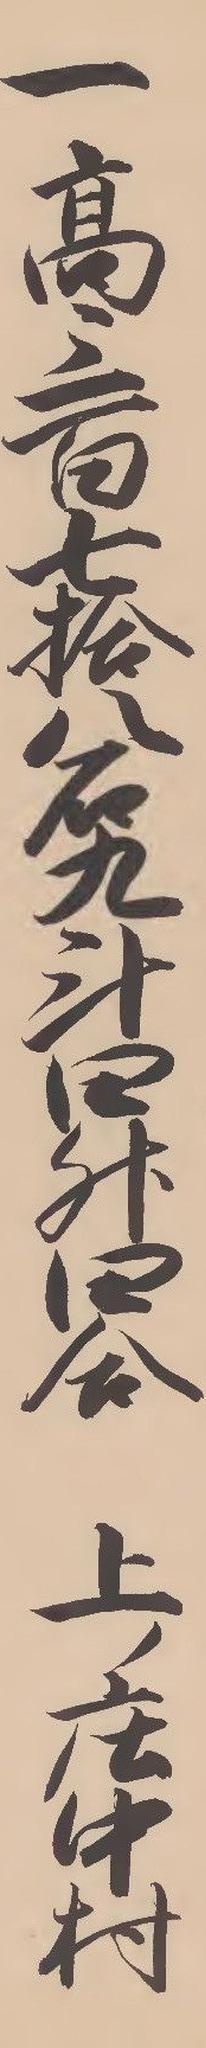一高三百七拾八石九斗四升四合上ノ庄中村
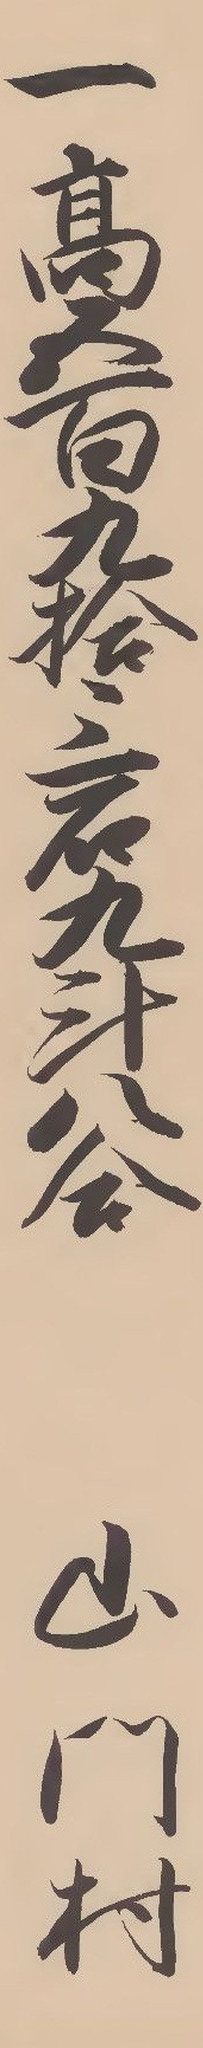一高五百九拾三石九斗八合山門村
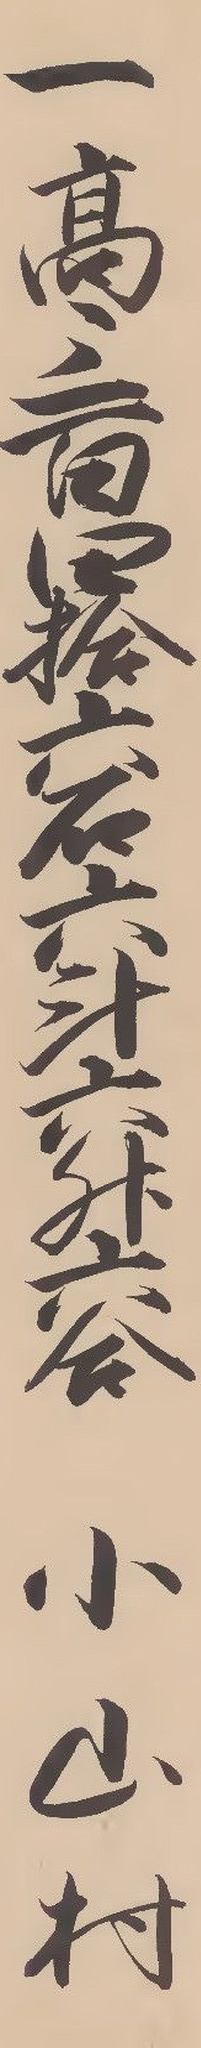一高三百四拾六石六斗六升六合小山村
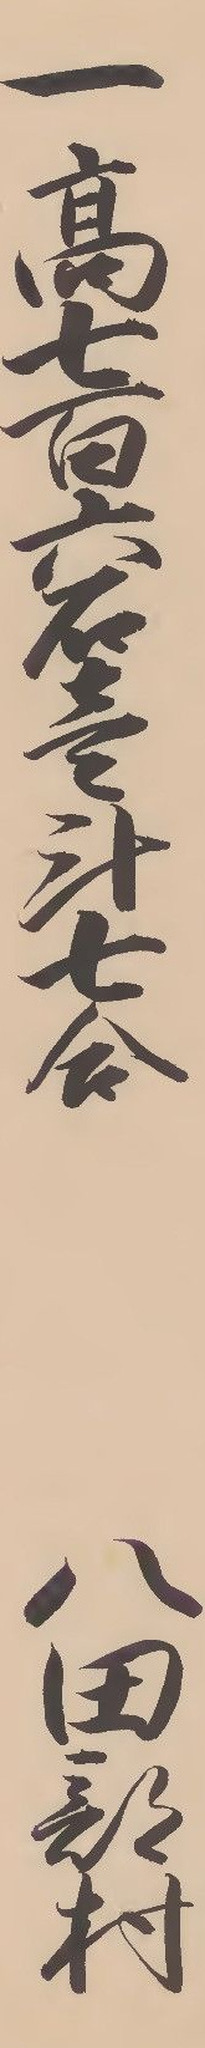一高七百六石壱斗七合八田部村

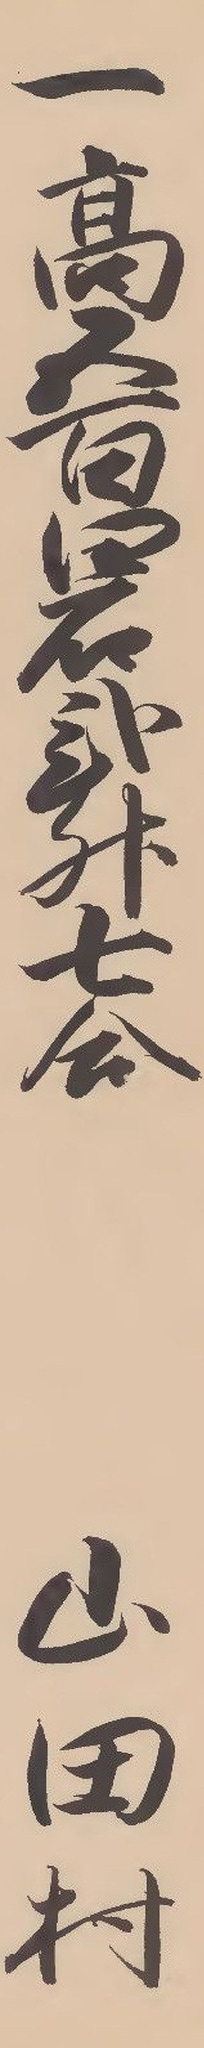一高五百四石弐升七合山田村
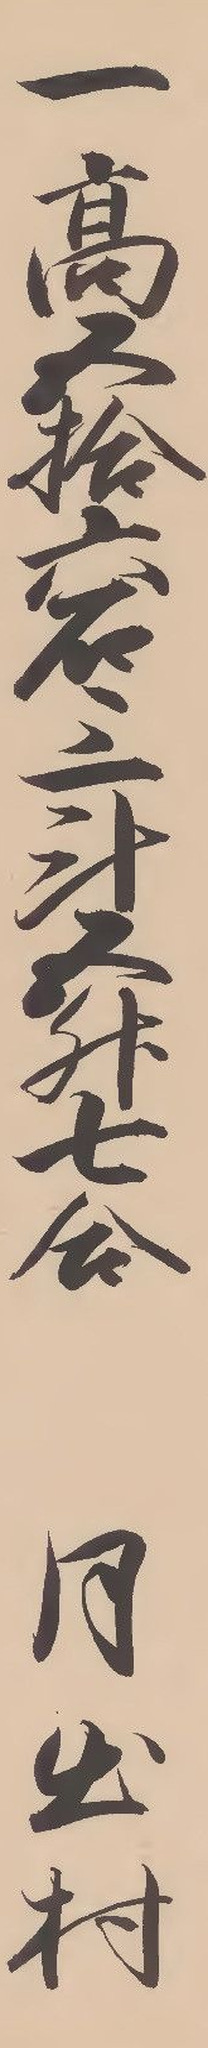一高五拾六石三斗五升七合月出村
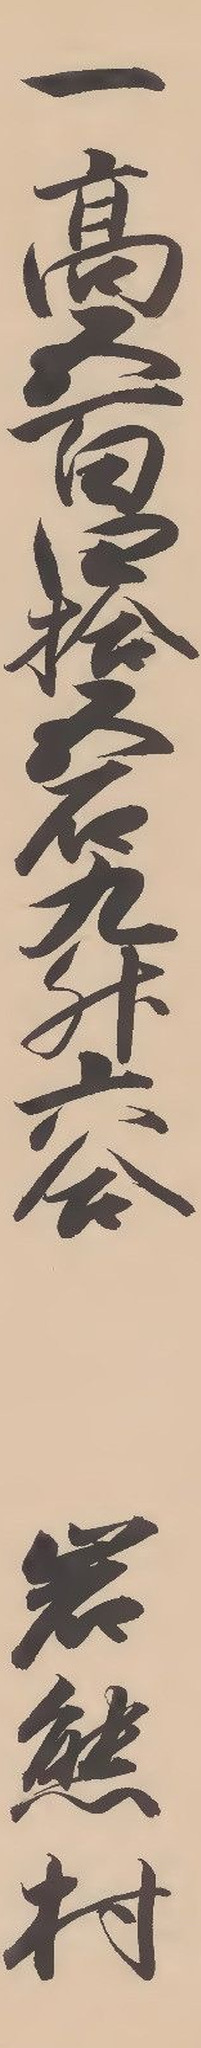一高五百四拾五石九升六合岩熊村
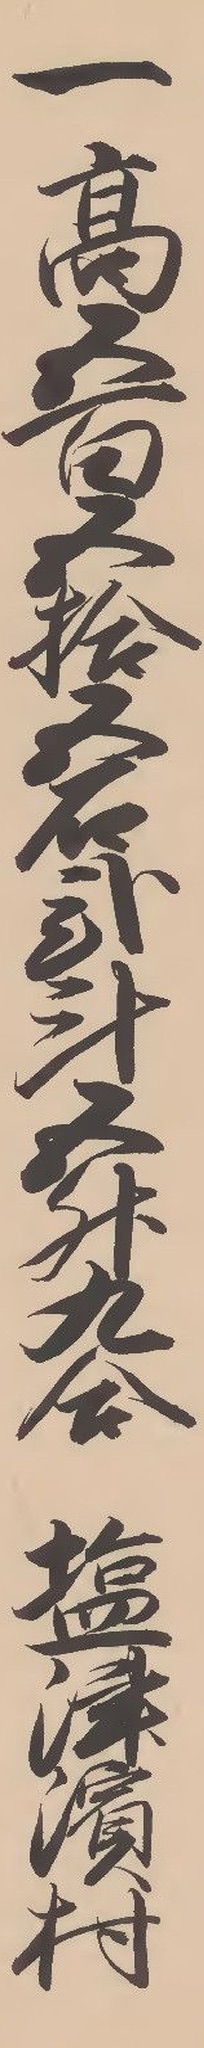一高五百五拾五石弐斗五升九合塩津浜村
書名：近江国郷帳
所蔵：国立公文書館 National Archives of Japan
